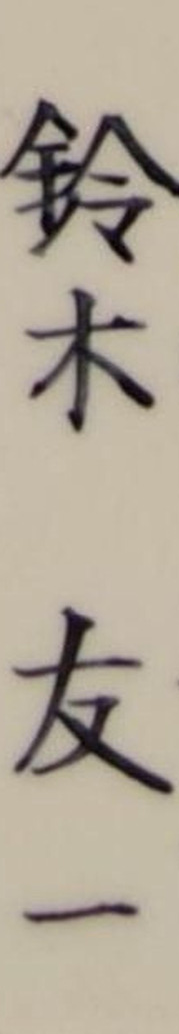鈴木友一
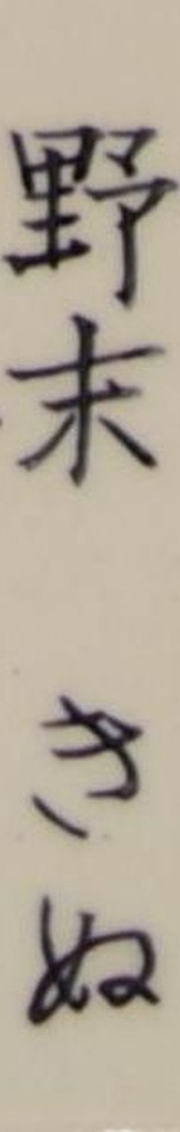野末きぬ
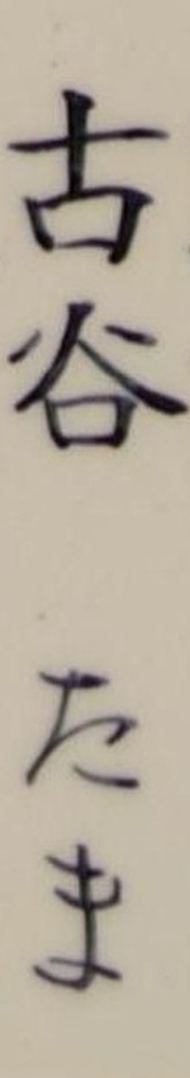古谷たま
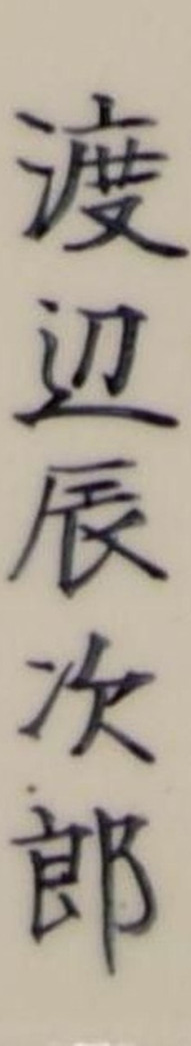渡辺辰次郎
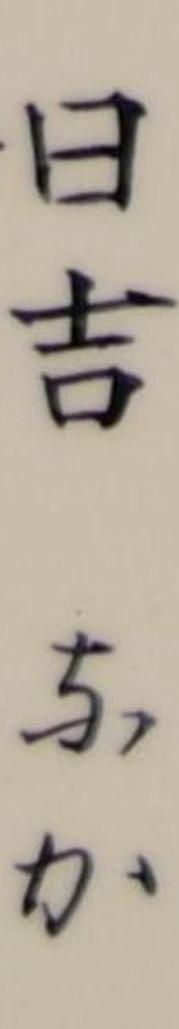日吉なか
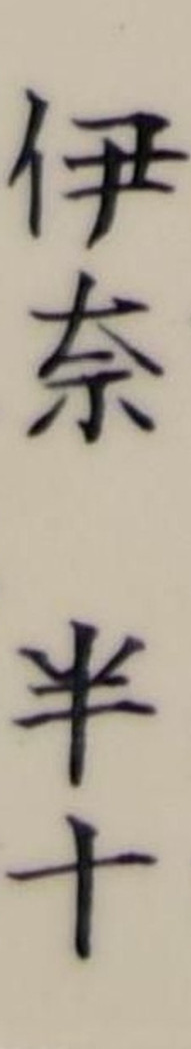伊奈半十
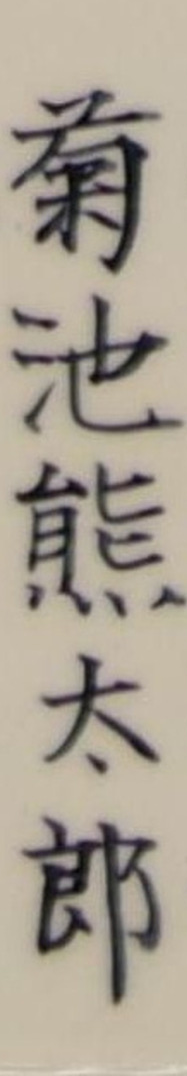菊池熊太郎
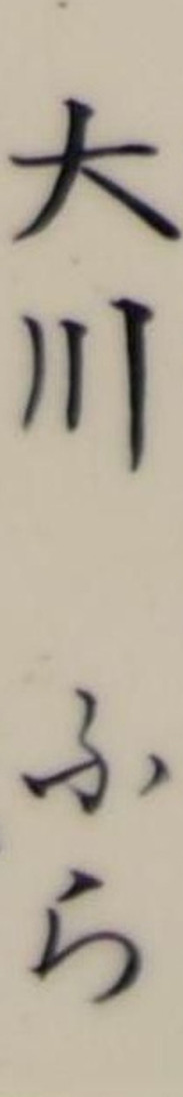大川ふら
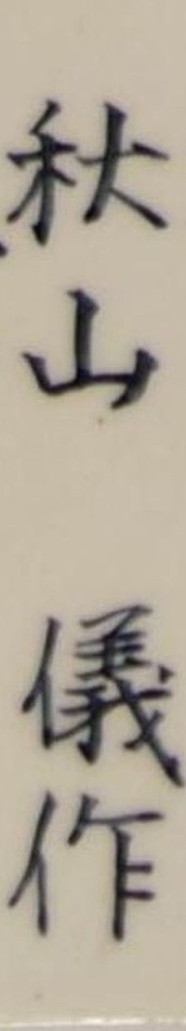秋山儀作
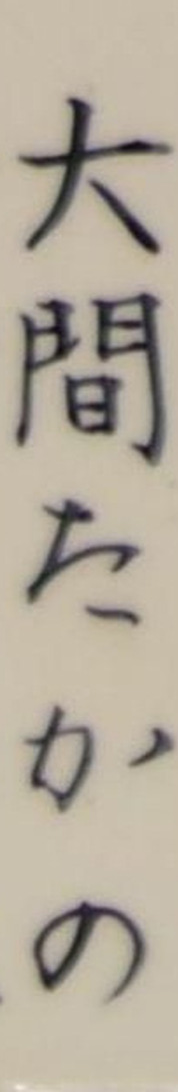大間たかの
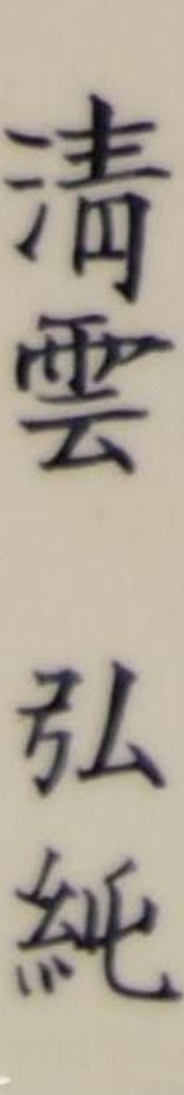清雲弘純
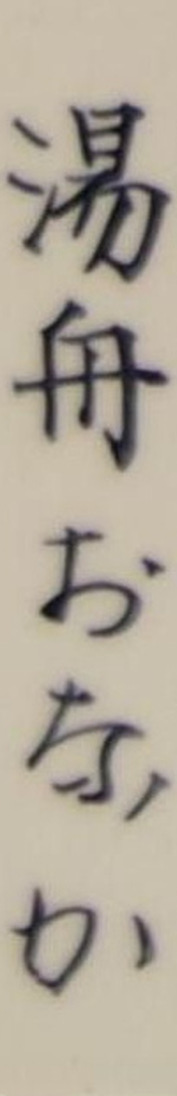湯舟おなか
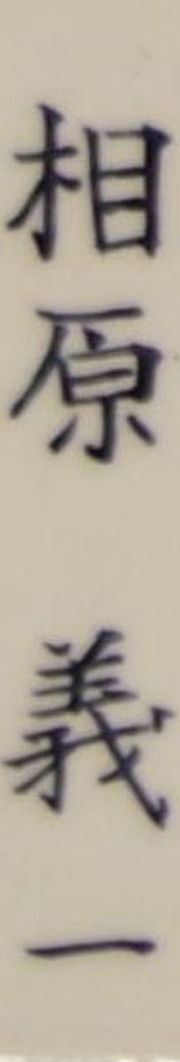相原義一
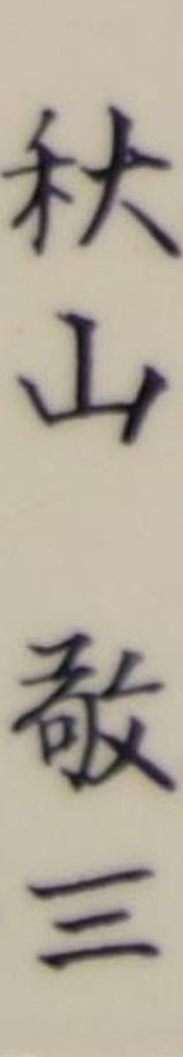秋山敬三
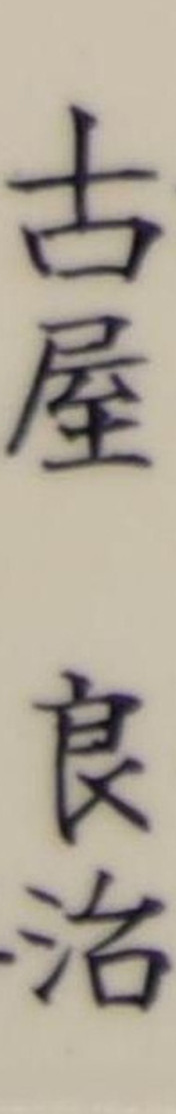古屋良治

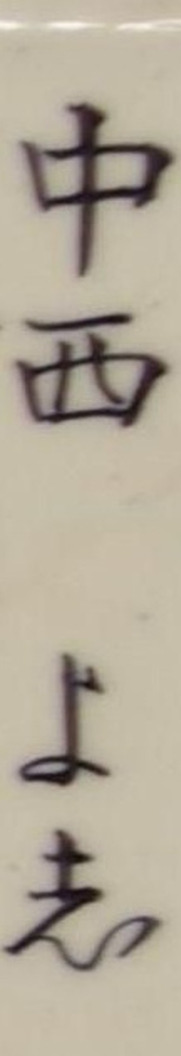中西よし
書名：M~S
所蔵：高野山金剛峯寺
